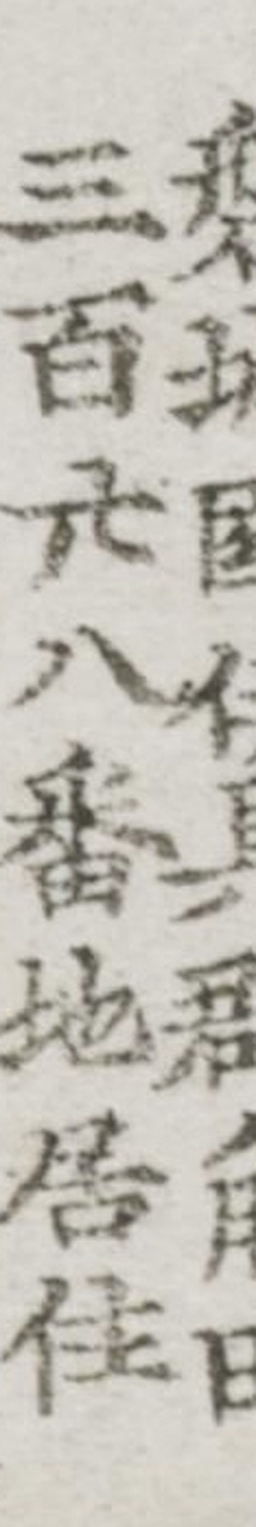三百廿八番地居住
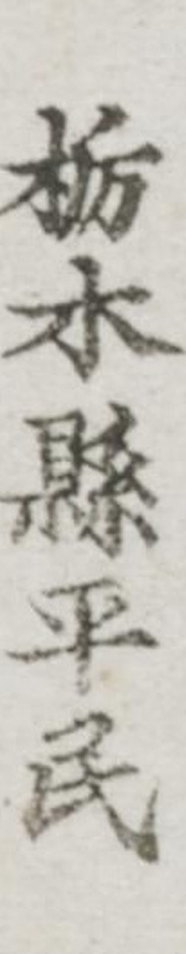栃木縣平民
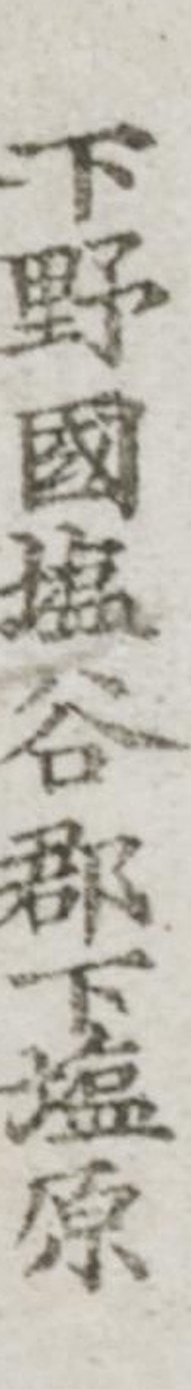下野國塩谷郡下塩原
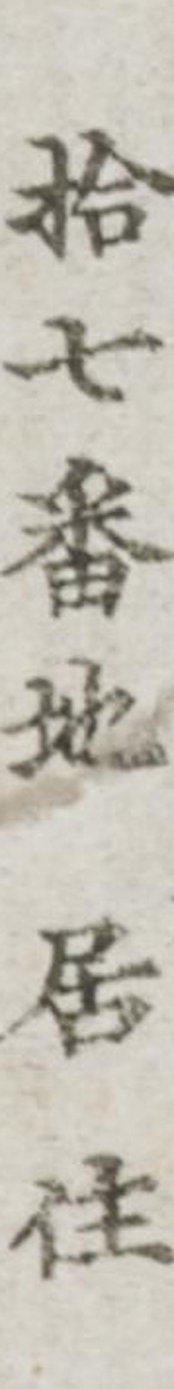拾七番地居住
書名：塩原繁昌記　全
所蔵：東京大学地震研究所図書室 Earthquake Research Institute Library, The University of Tokyo, JAPAN
